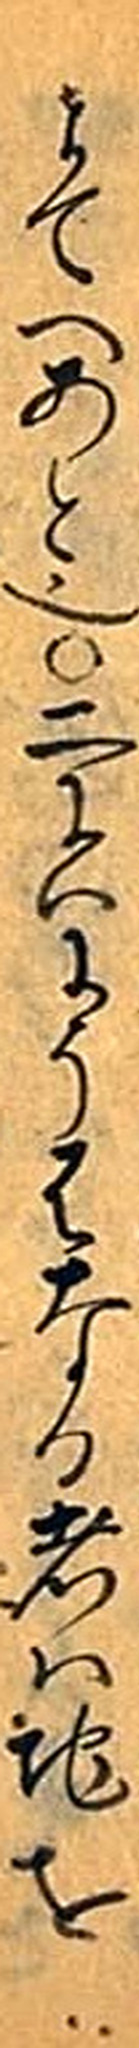よてへあと也○二にはにうはなる者は地を
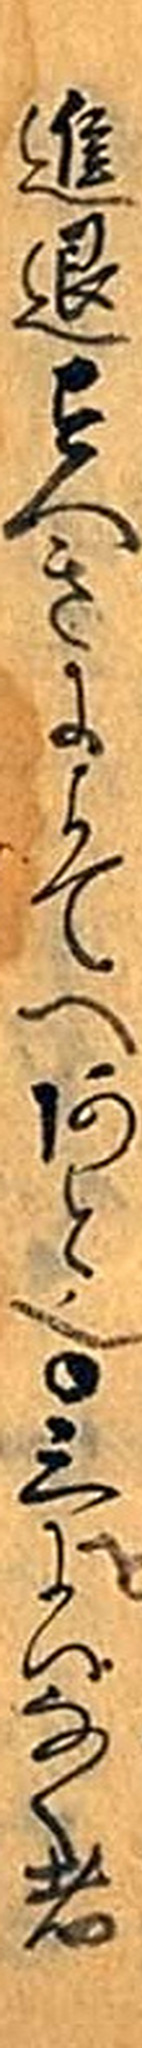進退すへきによてへあと也○三にはなく者
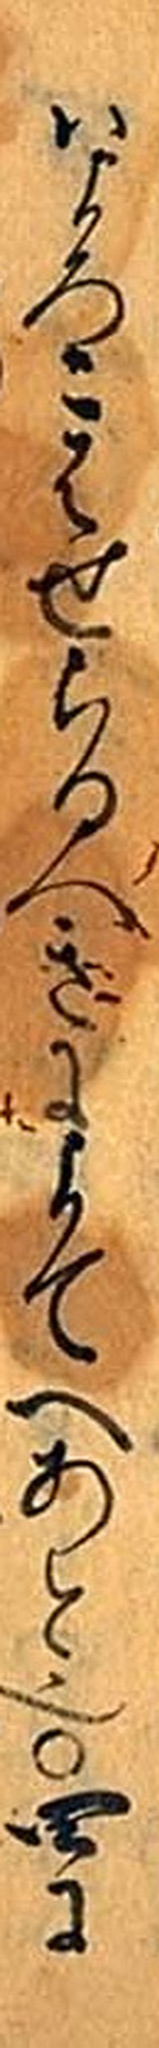はよろこはせるへきによてへあと也○四に
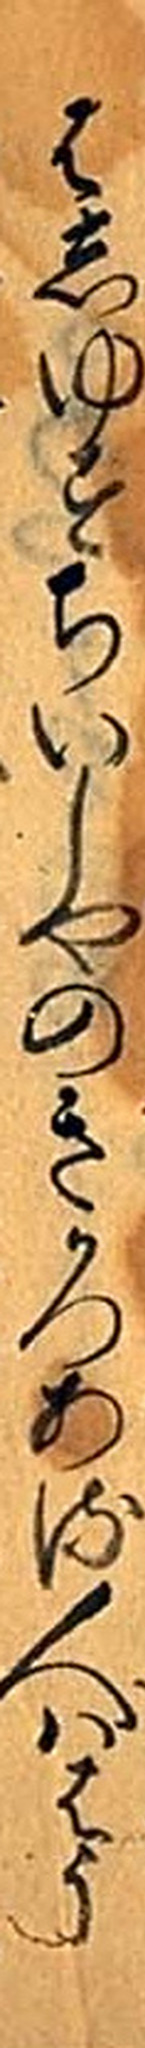はしゆすちいしやのきかつある人ははう
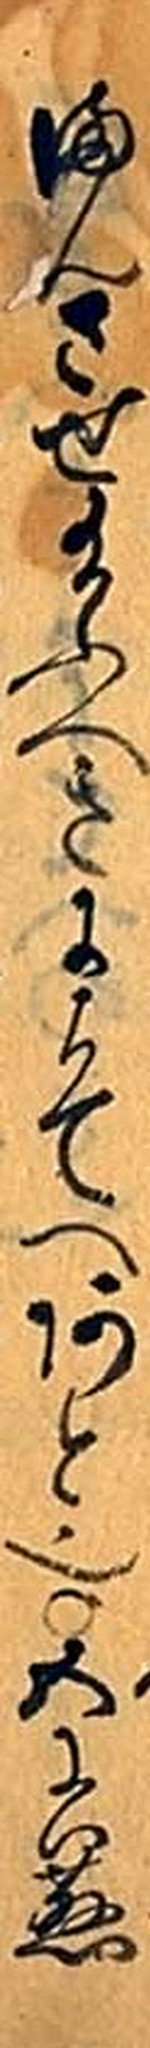まんさせ給ふへきによてへあと也○五には慈
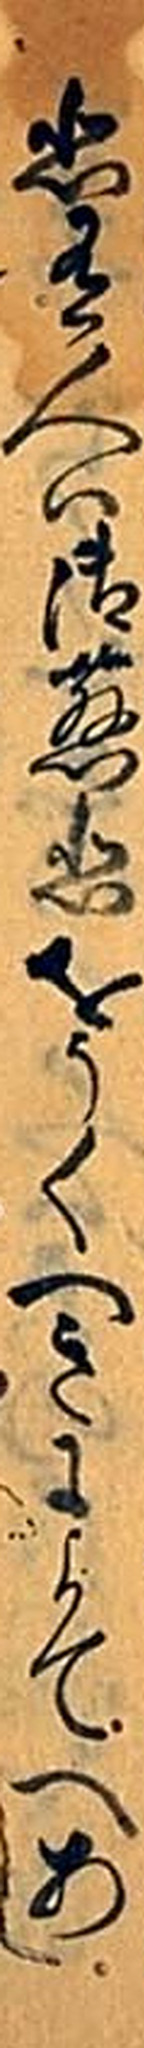悲有人は御慈悲をうくへきによてへあ
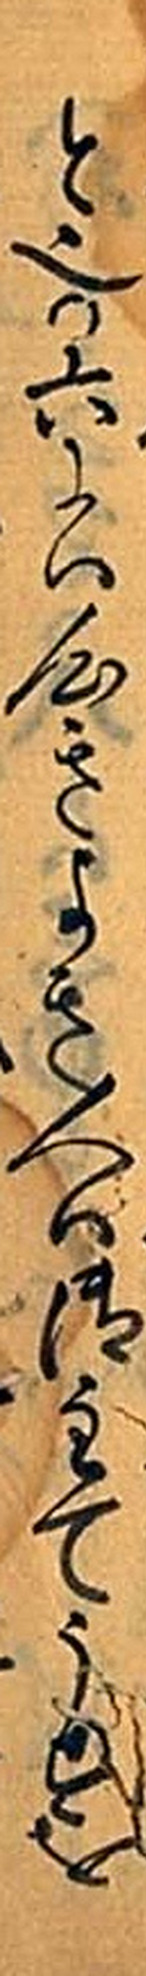と也○六には心きよき人は御主てうすを
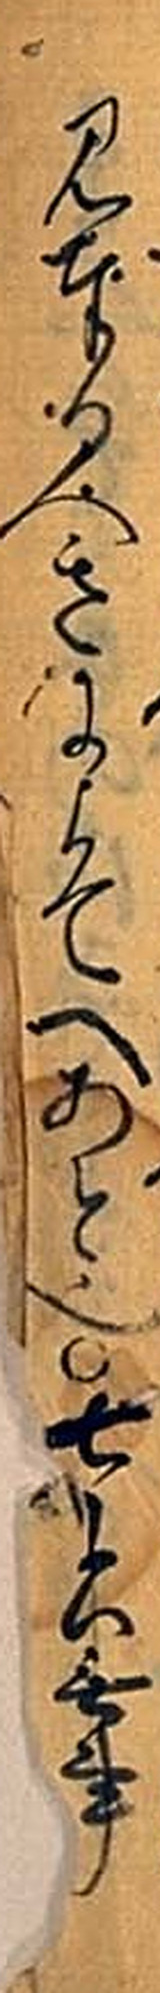見奉るへきによてへあと也○七には無事

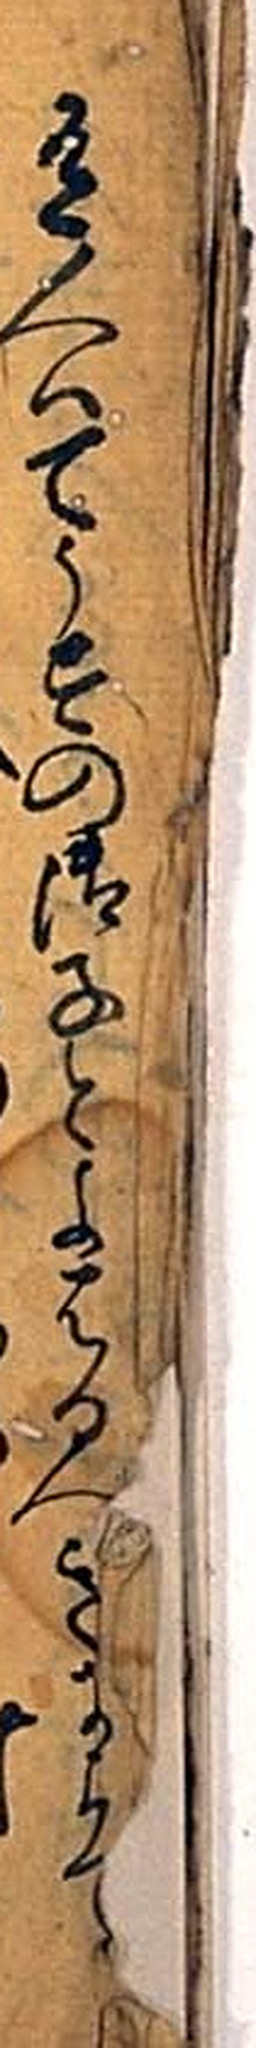有人はてうすの御子とよはるへきによて
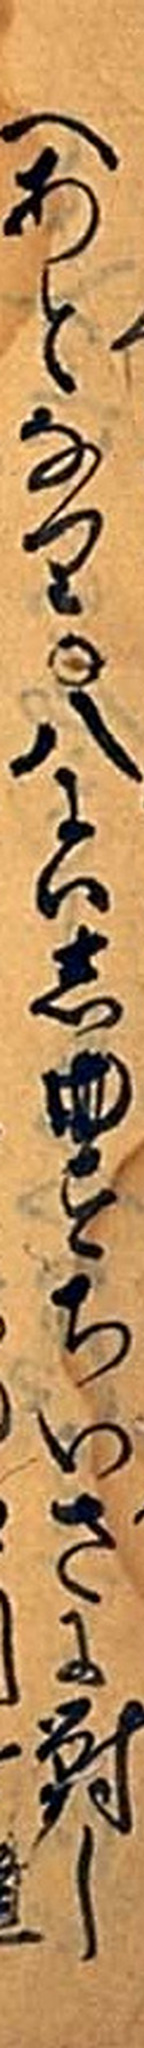へあとなり○八にはしゆすちいさに対し
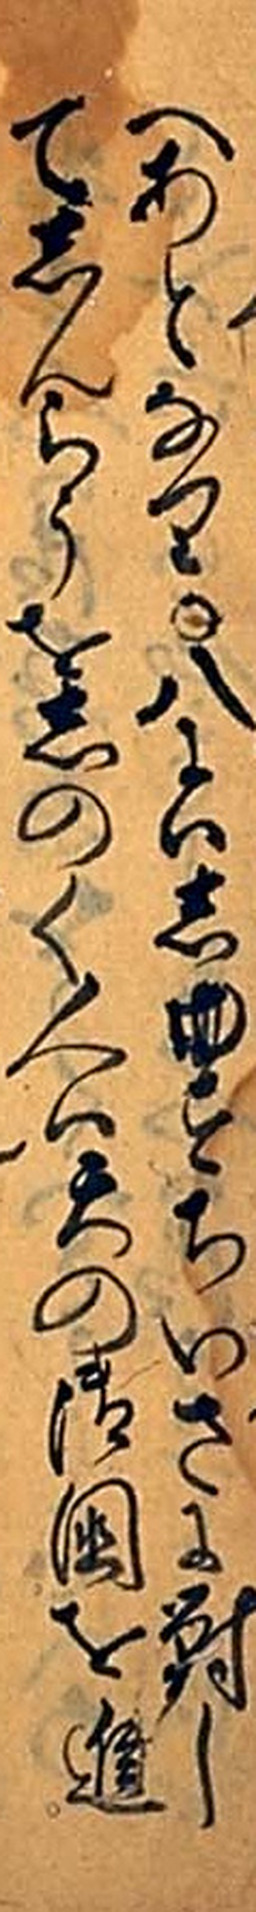てしんらうをしのく人は天の御国を進
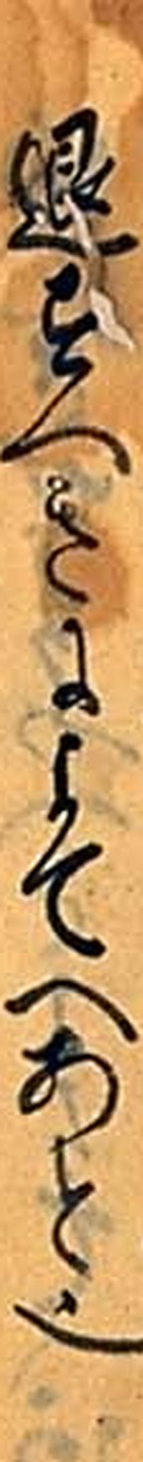退すへきによてへあと也
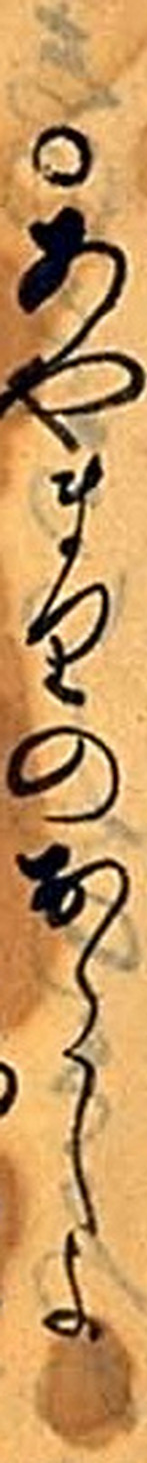○あやまりのおらしよ
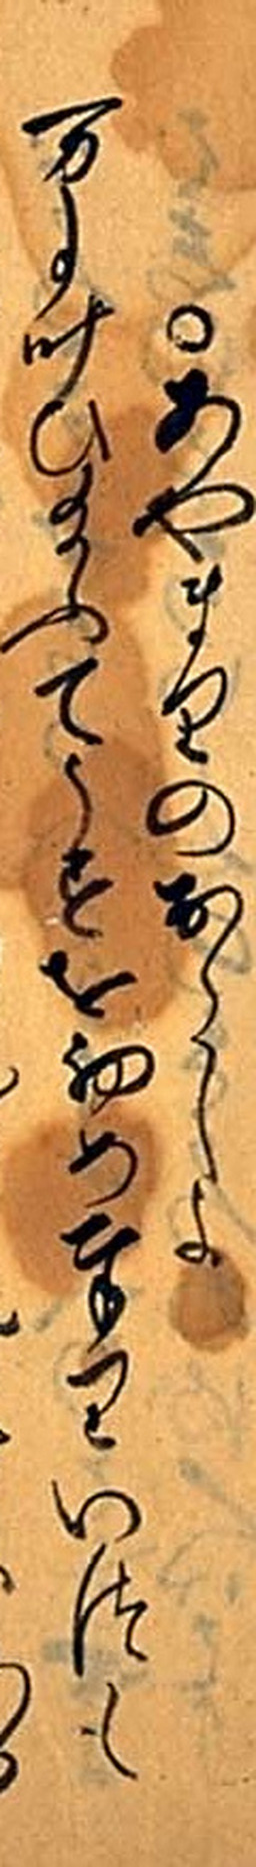万事叶ひ給ふてうすを初め奉りいつも
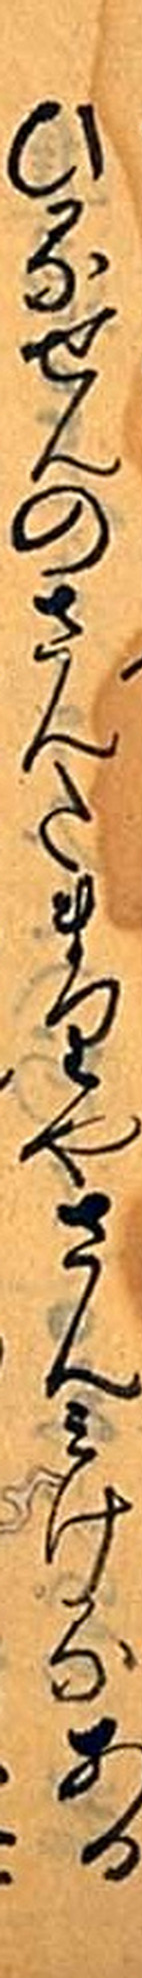ひるせんのさんたまりやさんみけるある
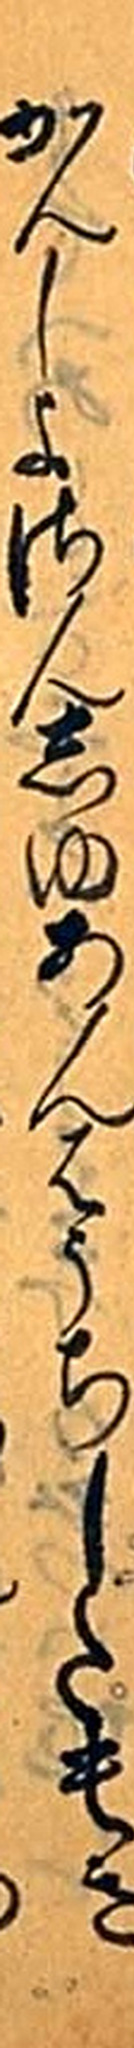かんしよさんしゆあんはうちした貴き
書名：ドチリナ・キリシタン
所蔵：東京大学総合図書館 / General Library in the University of Tokyo
